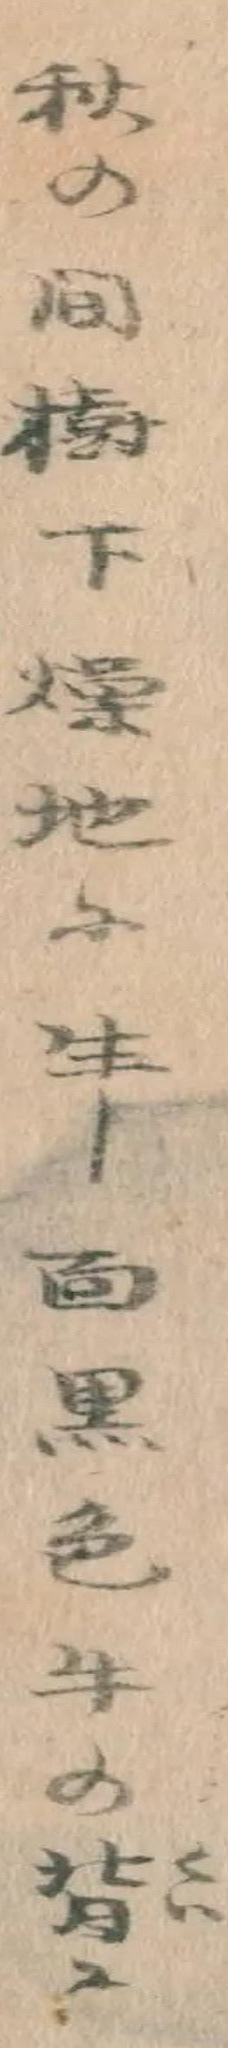秋の間樹下燥地に生し面黒色牛の背に
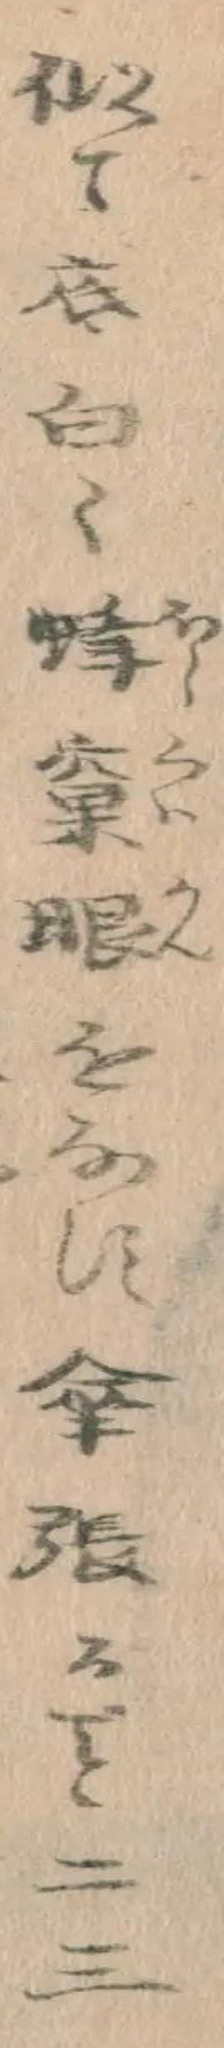似て底白く蜂窠眼をなす傘張ること二三
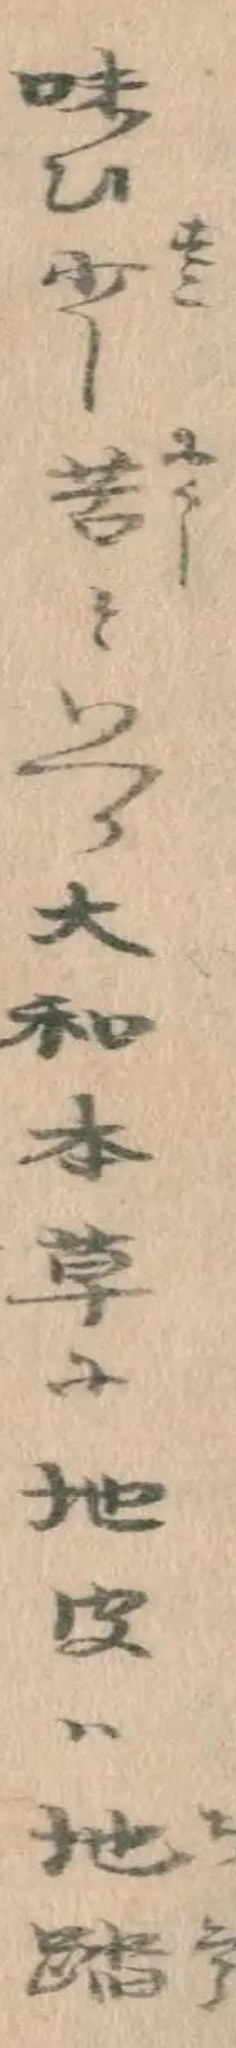味ひ少し苦といへり大和本草に地皮は地踏
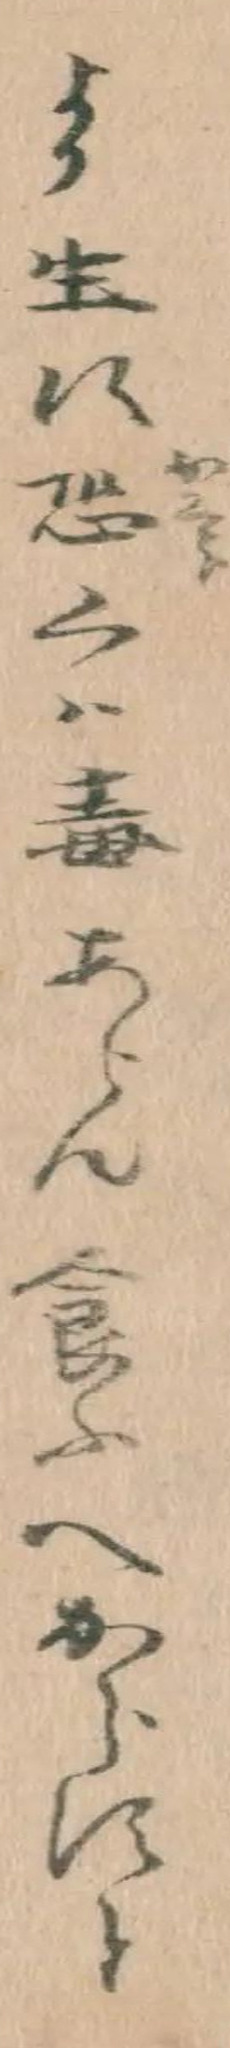より生す恐くは毒あらん食ふへからすと
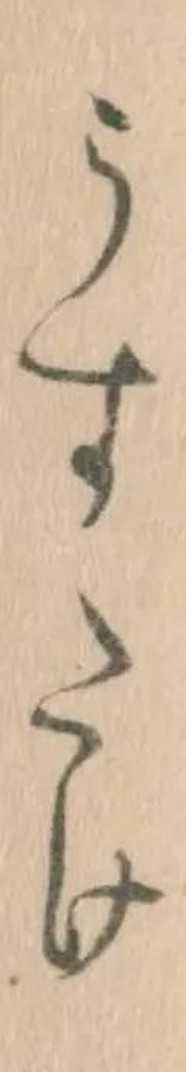うすたけ
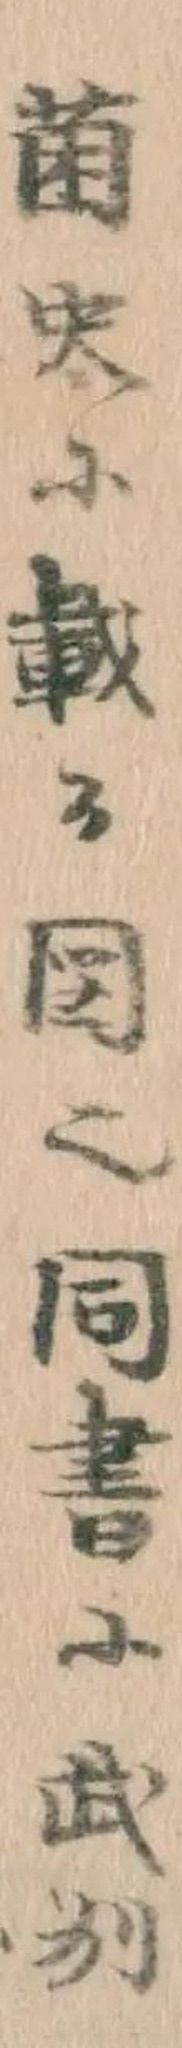菌史に載る図也同書に武州
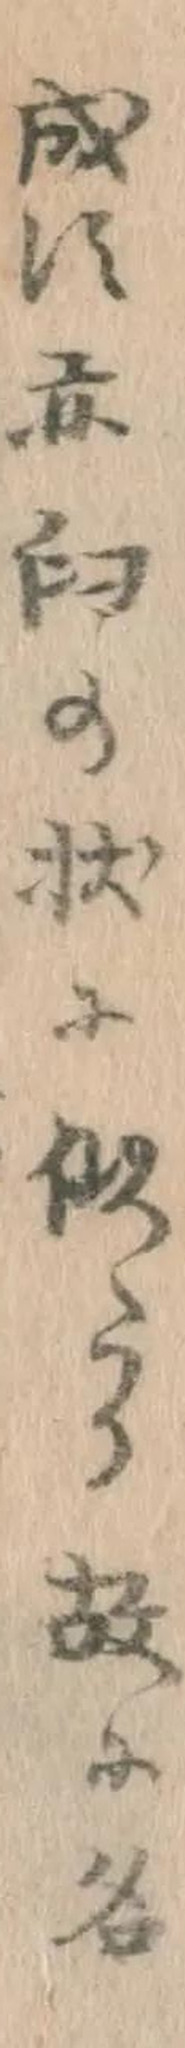成す亦臼の状に似たり故に名
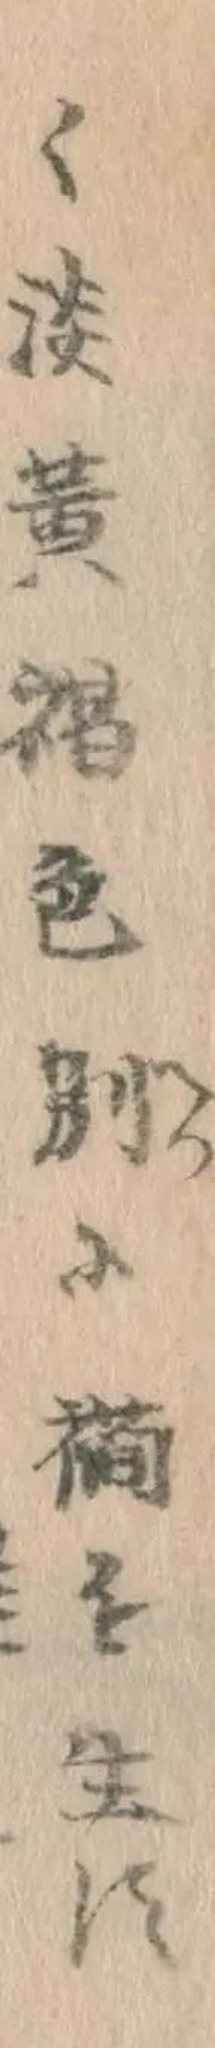く淡黄褐色別にを生す
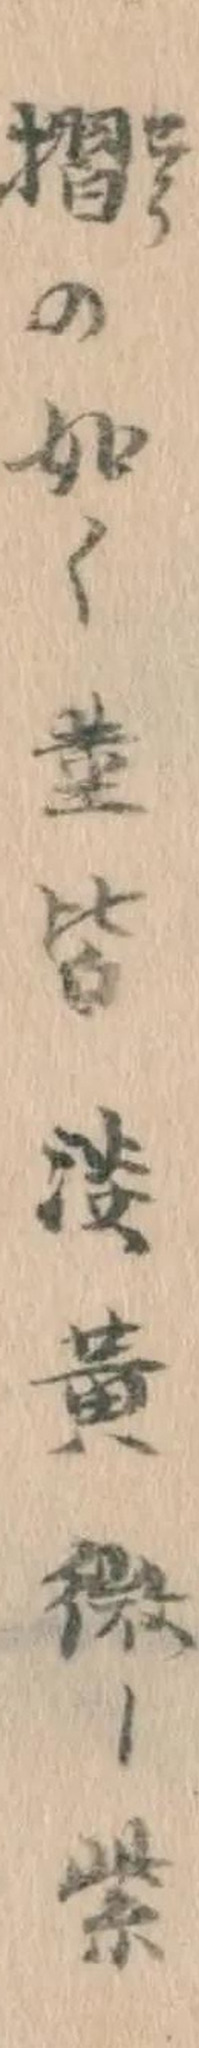摺の如く茎皆淡黄微し紫
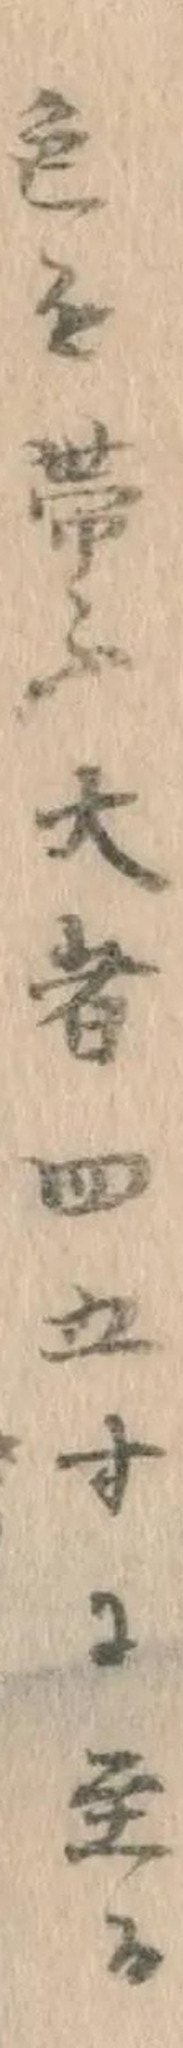色を帯ふ大者四五寸に至る
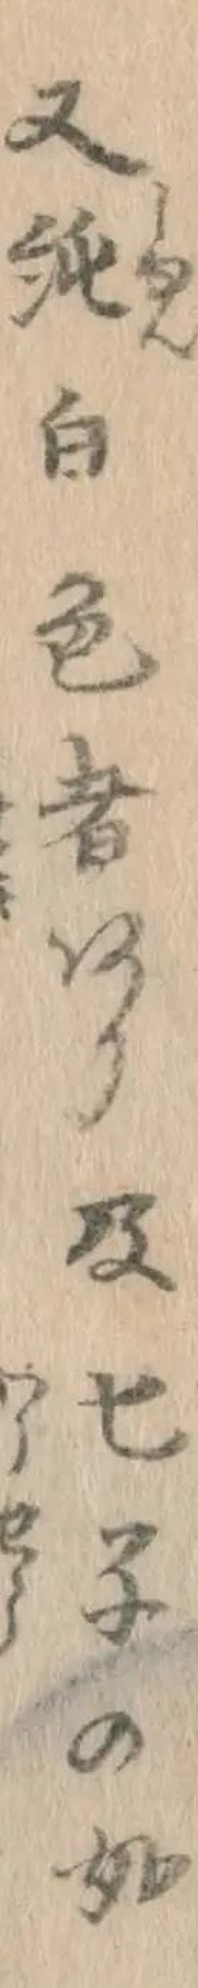又純白色者あり及匕子の如
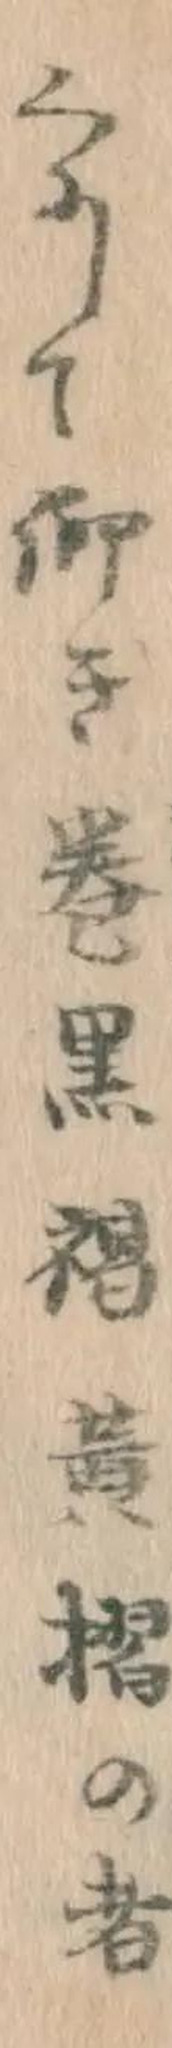くにして仰き巻黒褐黄摺の者
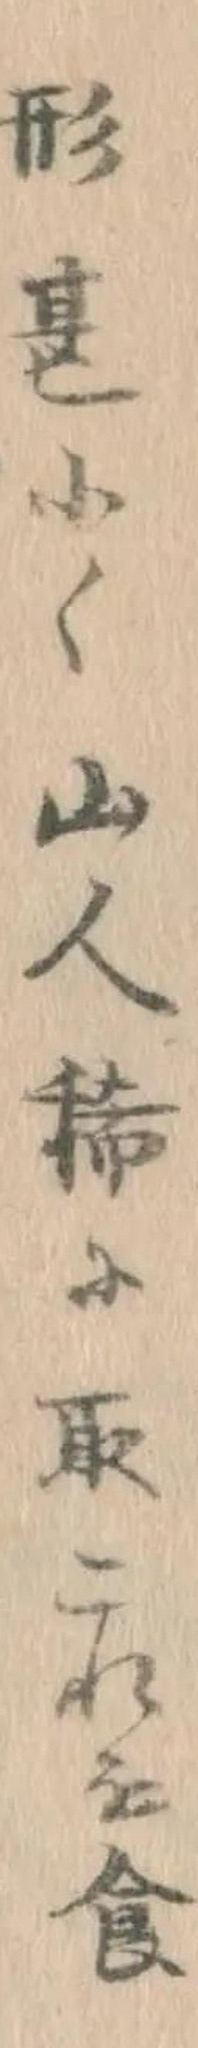形甚小く山人稀に取これを食
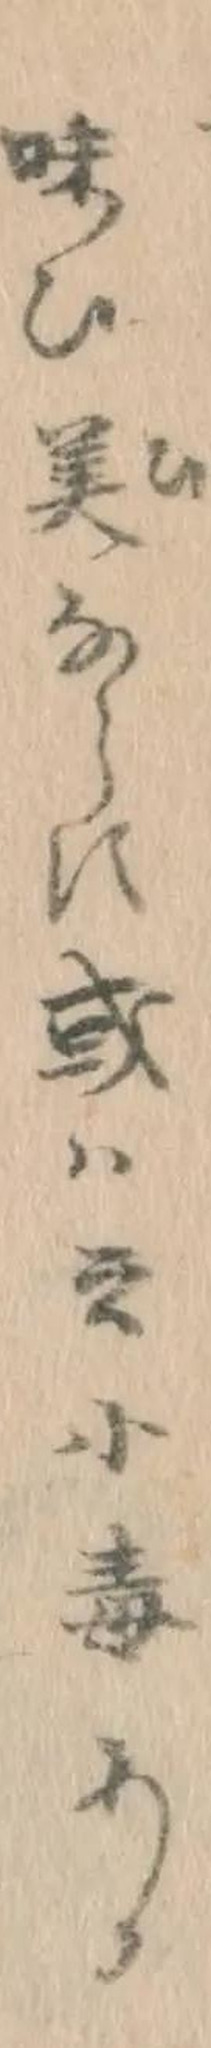味ひ美ならす或は云小毒あり
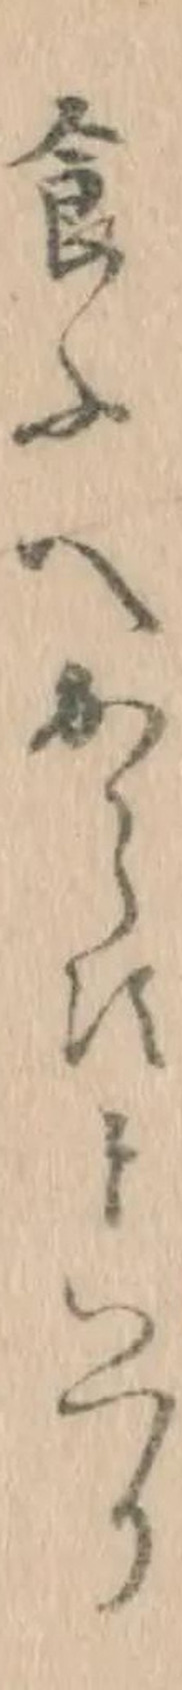食ふへからすといへり

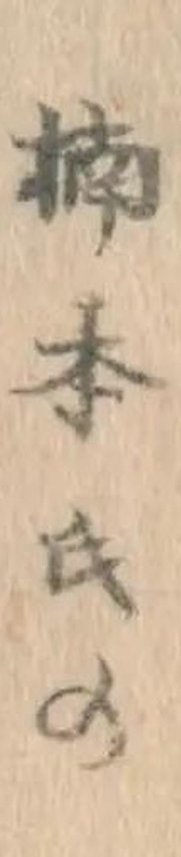楠本氏の
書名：本草図譜. 巻55-57
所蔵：国立国会図書館 National Diet Library, JAPAN
